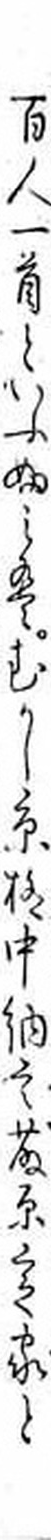百人一首といふふみは。むかし京極中納言藤原定家と
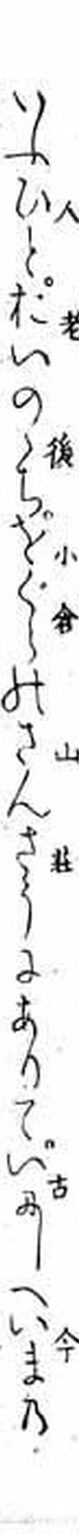いふひと。おいのゝち。をぐらのさんさうにありて。いにしへいまの
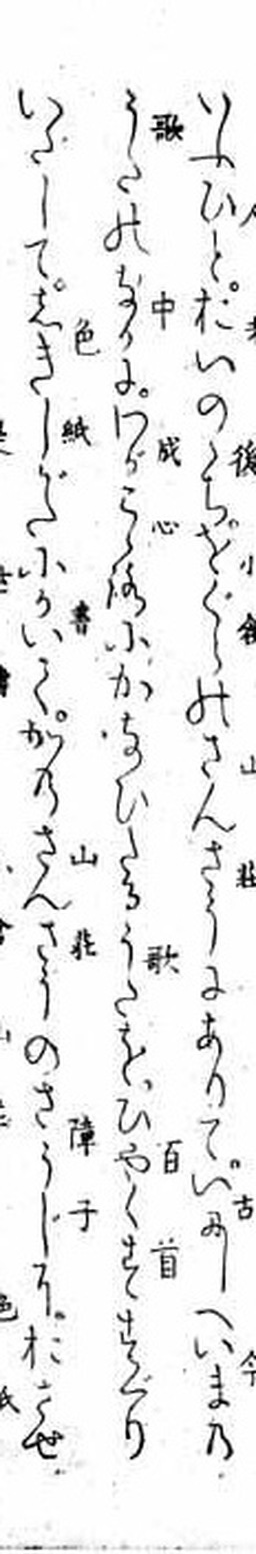うたのなかに。わがこゝろに。かなひたるうたを。ひやくすすぐり
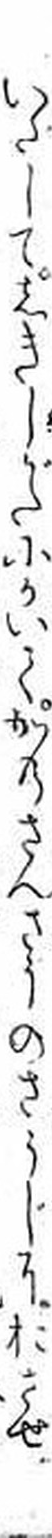いだして。しきしがたにかいて。かのさんさうのさうじに。おさせ。
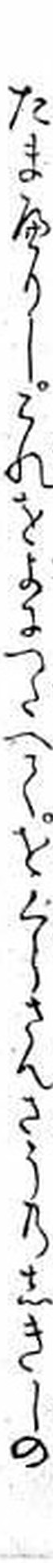たまへりし。これをよにつたへて。をぐらさんさうのしきしの

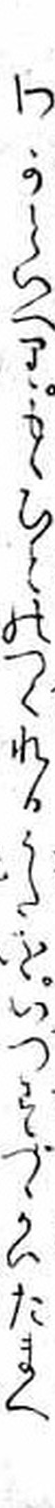わかといへり。もゝひとのつくれるうたを。いつすづゝかいたまへ
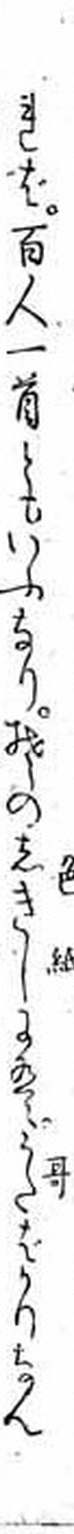れば。百人一首ともいふなり。そのしきしには。うたばかりなん
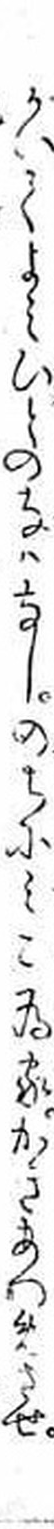かいてよみひとのなはなし。のちにみこ為家。かきあつめさせ。
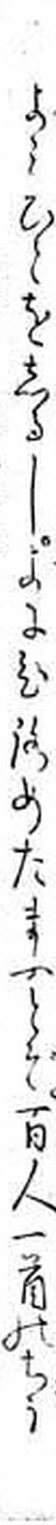よみひとをしるし。よにひろめたまふとぞ。百人一首のちう

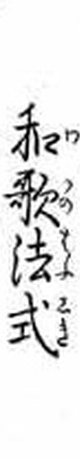和歌法式
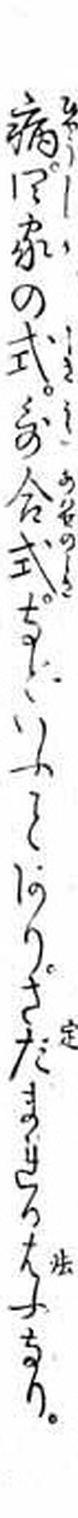病。四家の式。哥合式。などいふことあり。さだまれるはふなり。
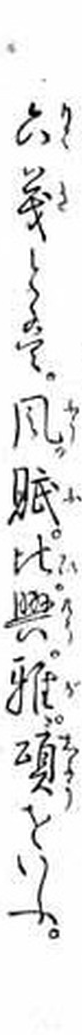六義とは。風。賦。比。興。雅。頌をいふ。

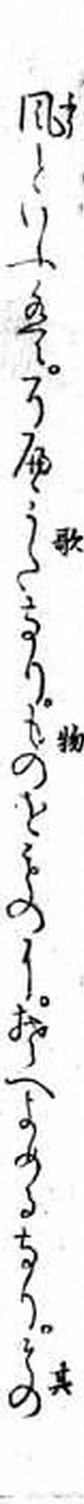風といふは。そへうたなり。ものをものに。そへよめるなり。その
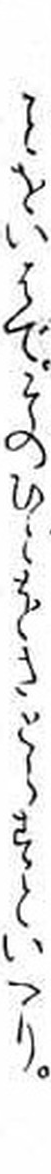ことをいはで。そのひとをさとらすといへり。
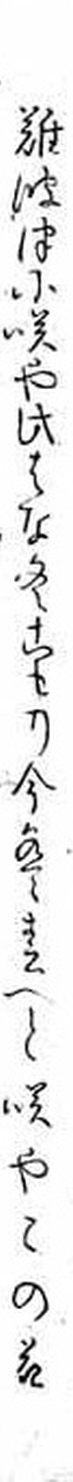難波津に咲や此はな冬こもり今は春へと咲やこの花
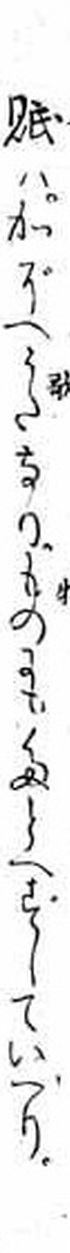賦は。かぞへうたなり。ものにもたとへずしていへり。
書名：女学範
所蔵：東京学芸大学教育コンテンツアーカイブ
